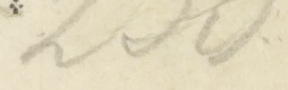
230
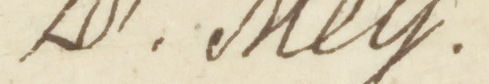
28. Meij.
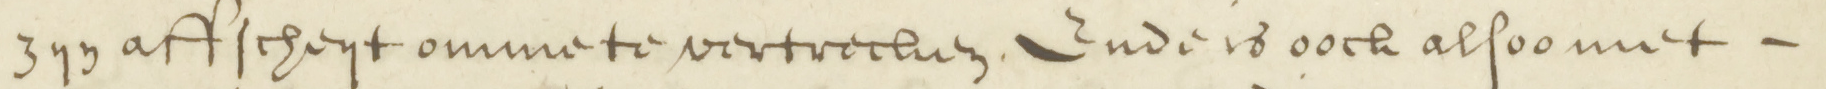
zyn affscheyt omme te vertrecken. Ende is oock alsoo met -
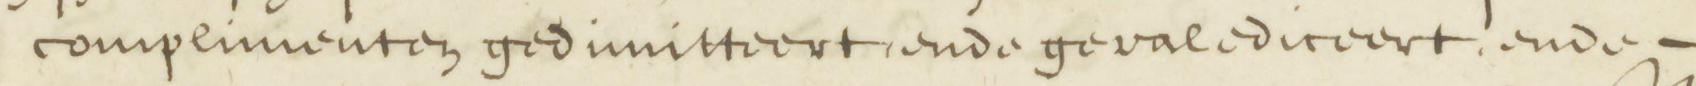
complimenten gedimitteert ende gevalediceert ende -
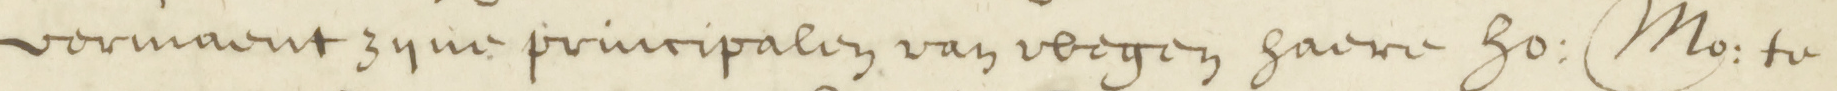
vermaent zyne principalen van wegen haere Ho:Mo: te
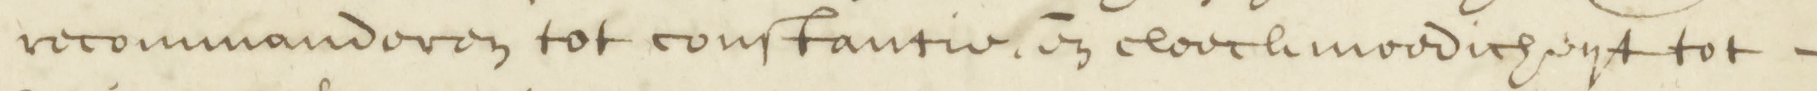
recommanderen tot constantie, en cloeckmoedicheyt tot
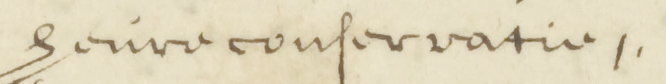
heure conservatie.
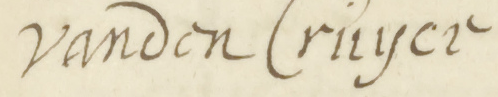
Vanden Cruyce
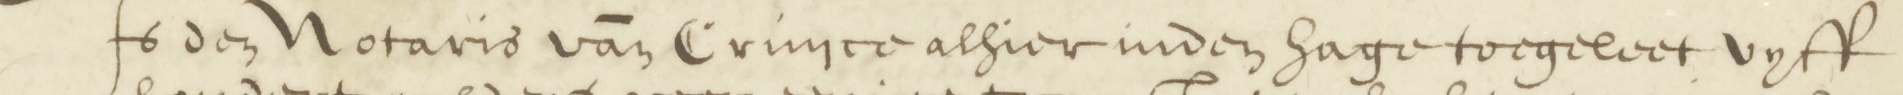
Is den Notaris van Cruyce alhier inden Hage toegeleet vyff
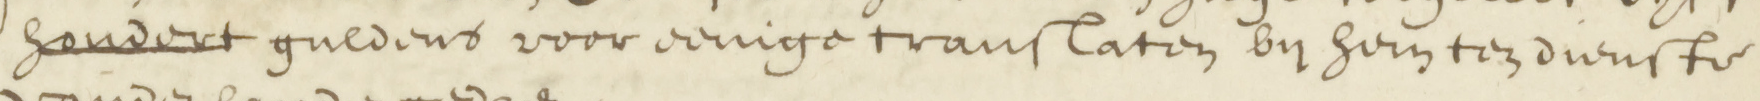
hondert guldens voor eenige translaten bij hem ten dienste
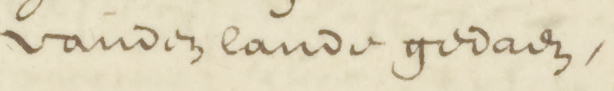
vanden lande gedaen.
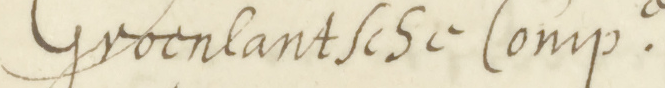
Groenlantsche Compe
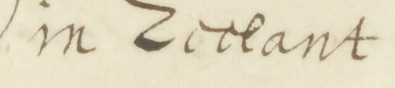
in Zeelant
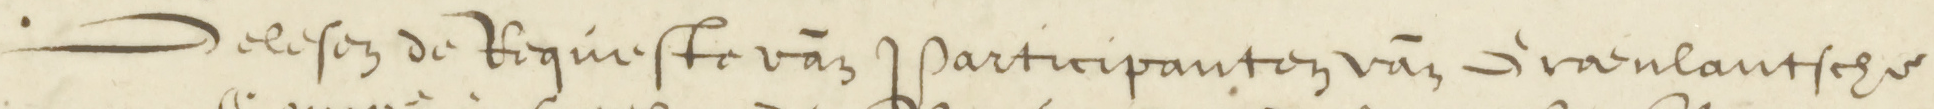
Gelesen de Requeste van participanten van Groenlantsche
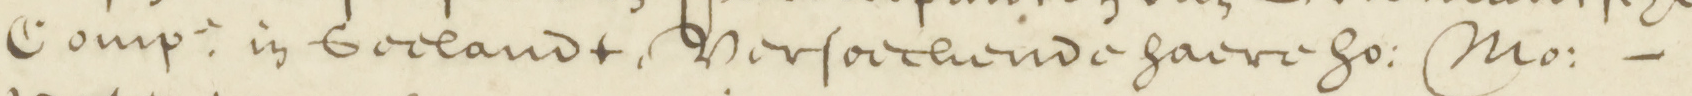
Compe in Seelandt. Versoeckende haere Ho:Mo: -
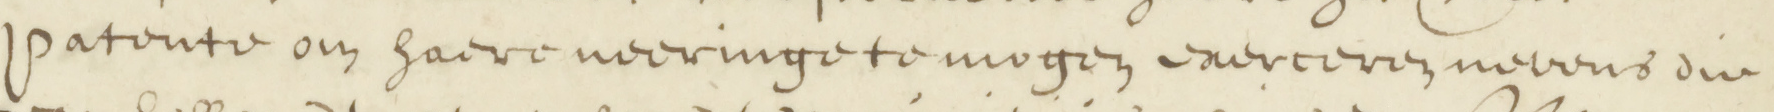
patente om haere neeringe te mogen exerceren nevens die
